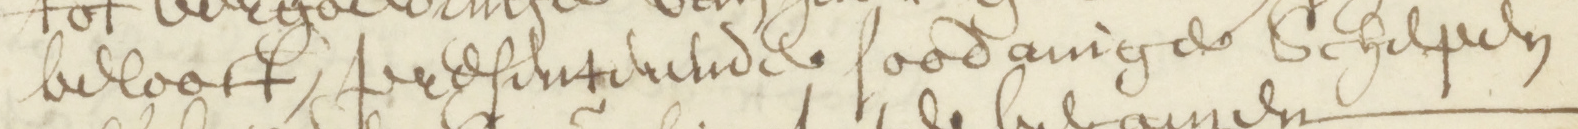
belooft, presenterende soodanige schepen
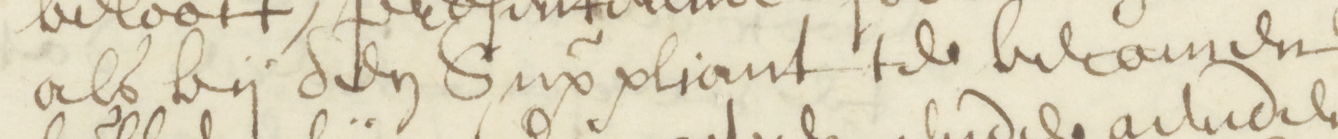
als bij den Suppliant te becomen
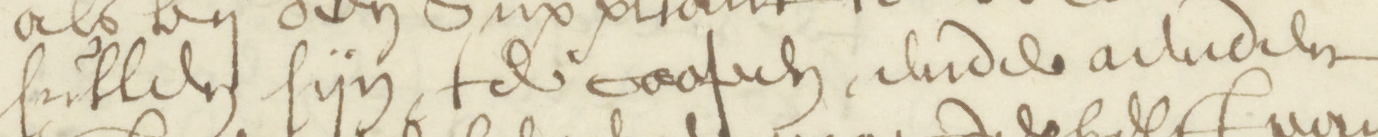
sullen sijn te coopen, ende aenden
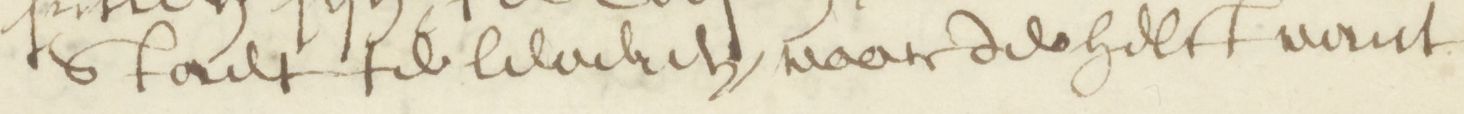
staet te leveren, voor de helft vant
